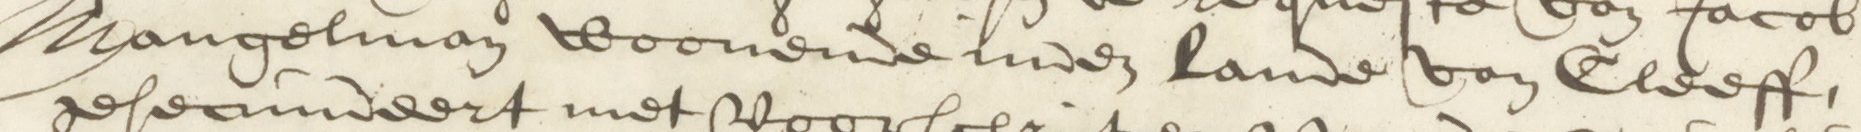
Mangelman woonende inden Lande van Cleeff,
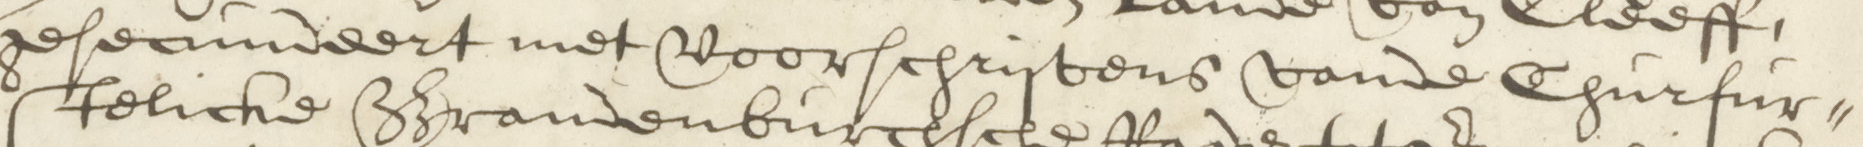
gesecundeert met Voorschrijvens vande Churfur„
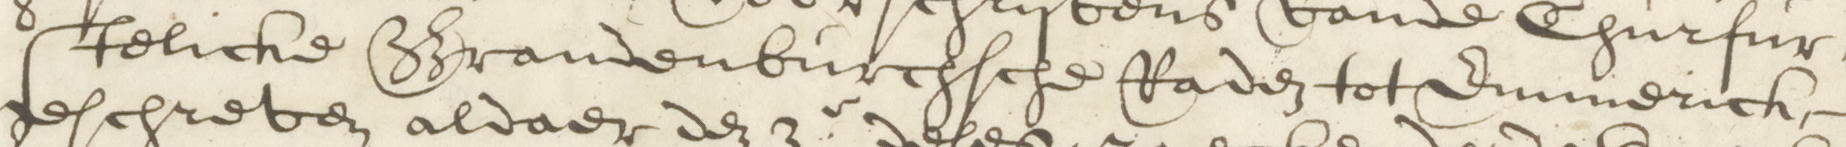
stelicke Brandenburchsche Raden tot Emmerick-
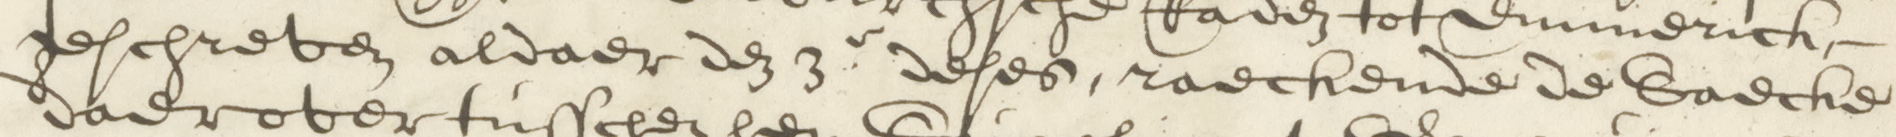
geschreven aldaer den 3e. deses, raeckende de Saecke
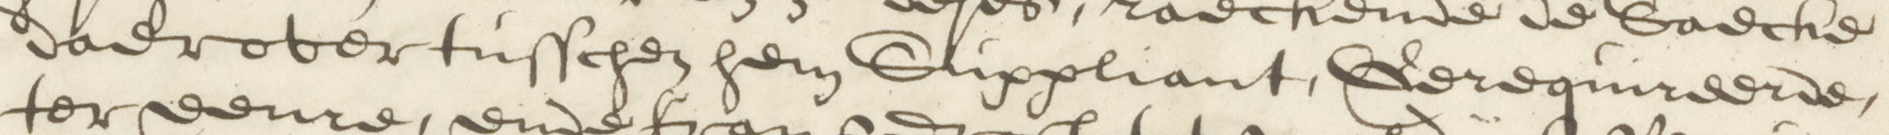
daerover tusschen hem Suppliant, Gerequireerde,
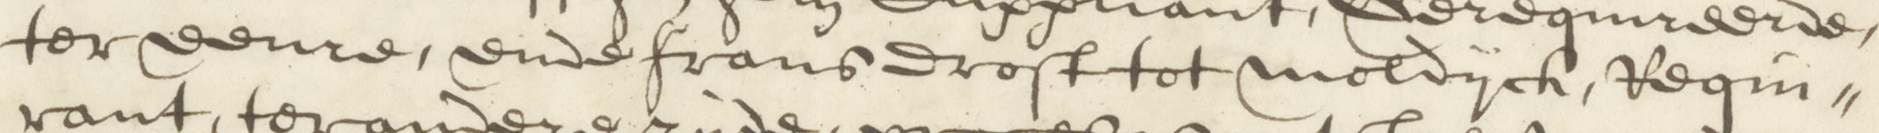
ter eenre, ende frans Drost tot Moldijck, Requi„
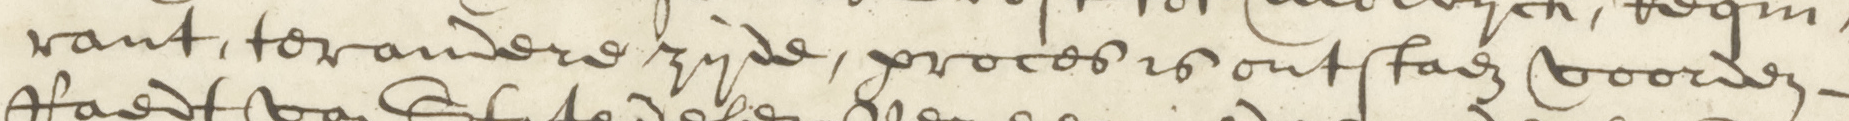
rant, ter andere zijde, proces is ontstaen voorden
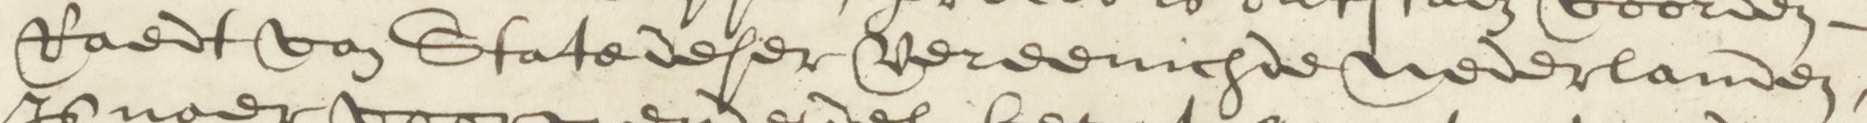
Raedt van State deser Vereenichde Nederlanden.
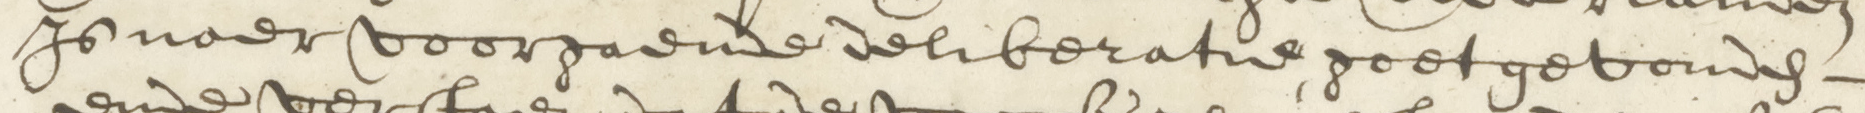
Is naer voorgaende deliberatie goetgevonden
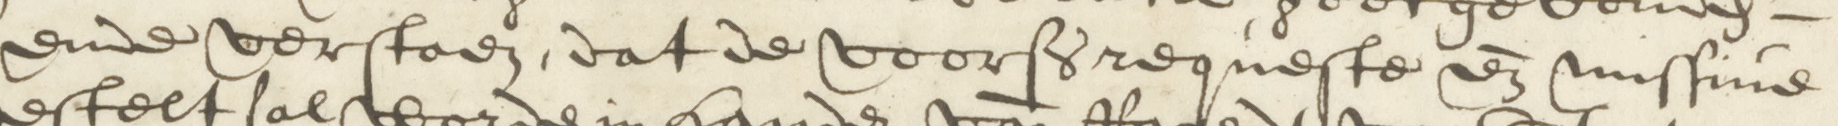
ende verstaen, dat de voors requeste en missive
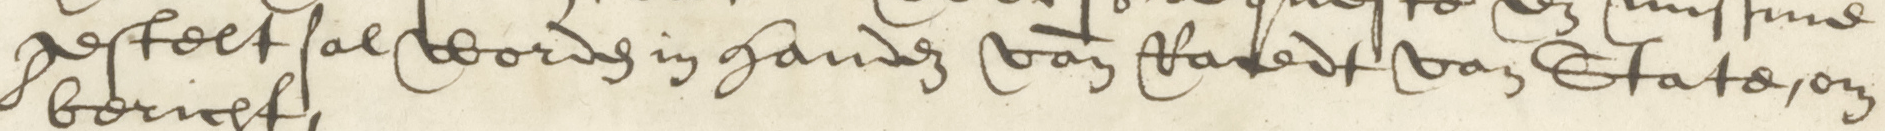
gestelt sal worden in handen van Raedt van State, om
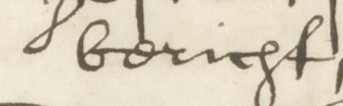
bericht
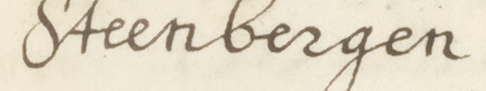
Steenbergen
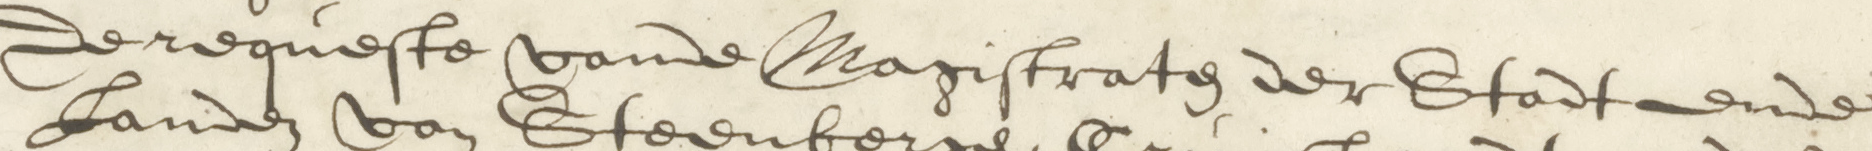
De requeste vande Magistraten der Stadt ende
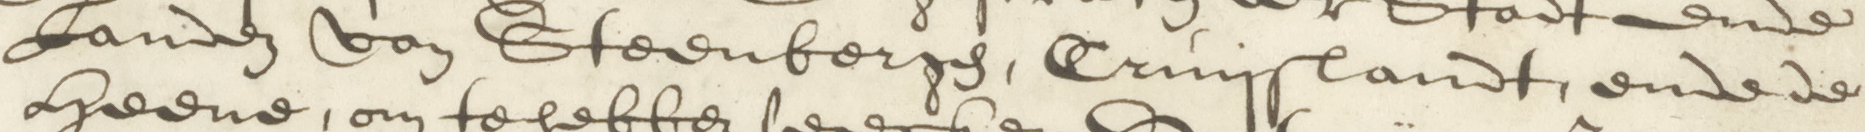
Landen van Steenbergen, Cruijslandt, ende de
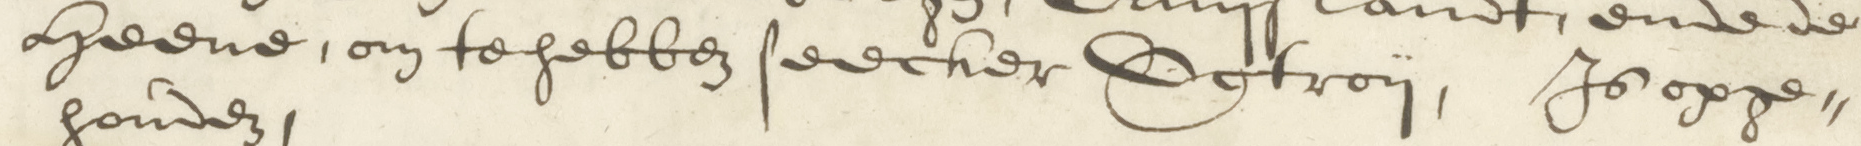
Heene, om te hebben seecker Octroij, Is opge„
